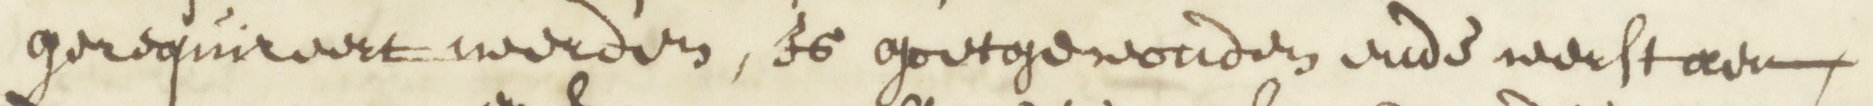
gerequireert werden, Is goetgevonden ende verstaen,
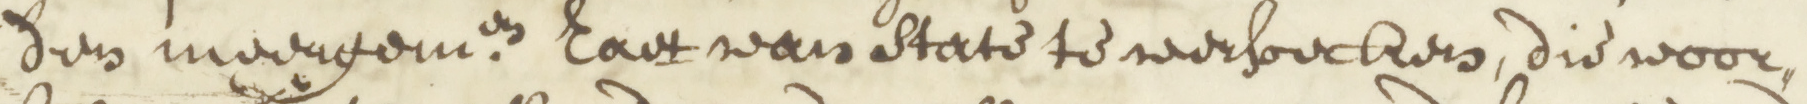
den meergemen. Raet van State te versoecken, die voor„
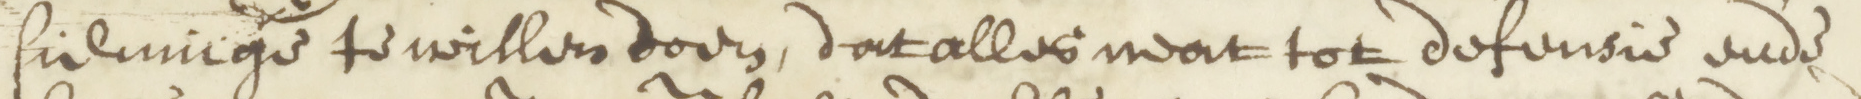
sieninge te willen doen, dat alles wat tot defensie ende
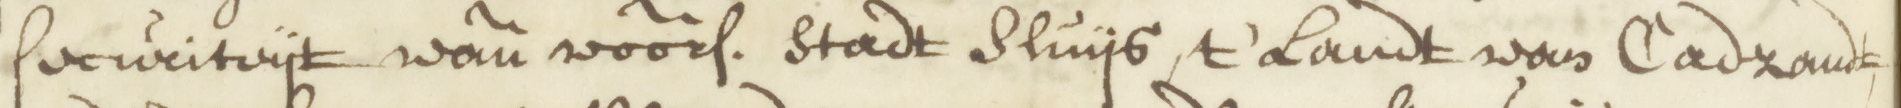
securiteijt van voors. Stadt Sluijs, t' Landt van Cadzandt
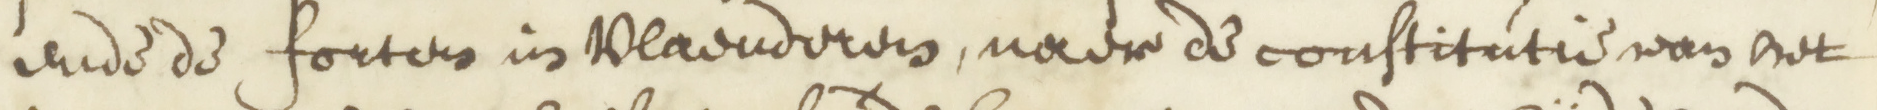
ende de forten in Vlaenderen, naer de constitutie van het
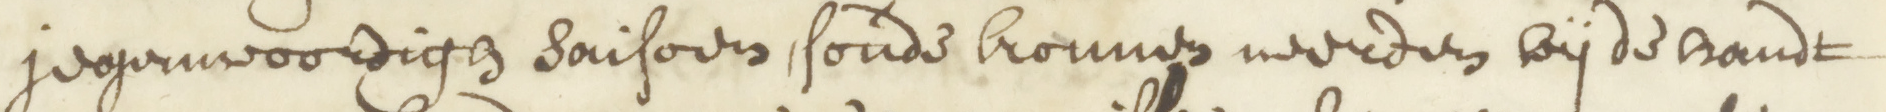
jegenwoordigh Saisoen, soude konnen werden bij de handt
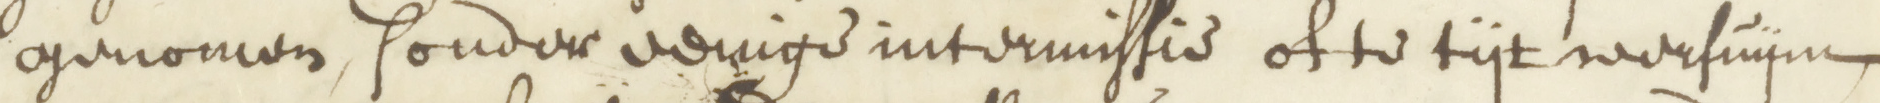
genomen, sonder eenige intermissie ofte tijt versuijm
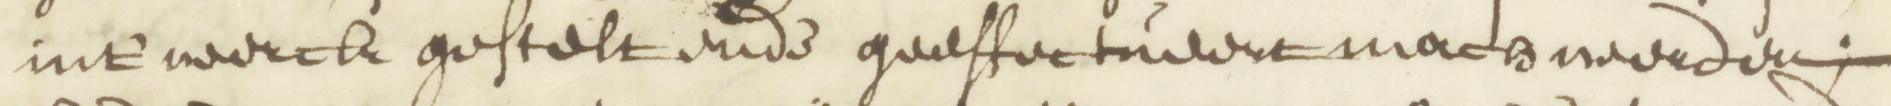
int' werck gestelt ende geeffectueert mach werden.
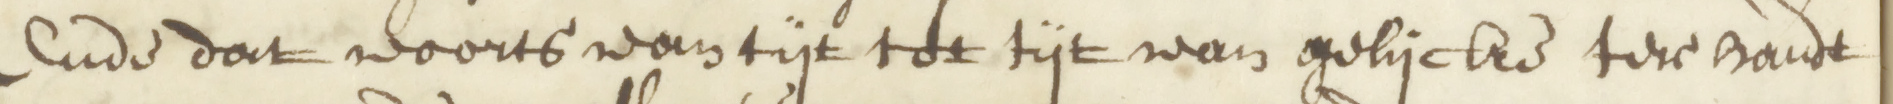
Ende dat voorts van tijt tot tijt van gelijcke ter handt
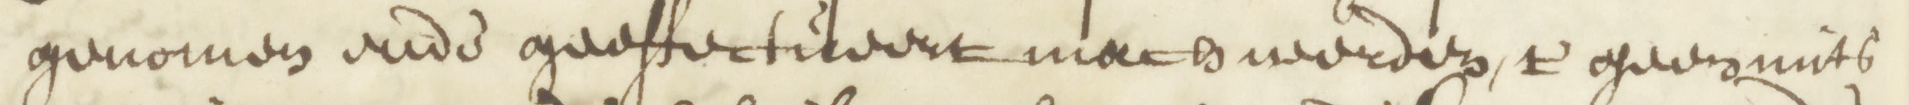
genomen ende geeffectueert mach werden, t' geen mits
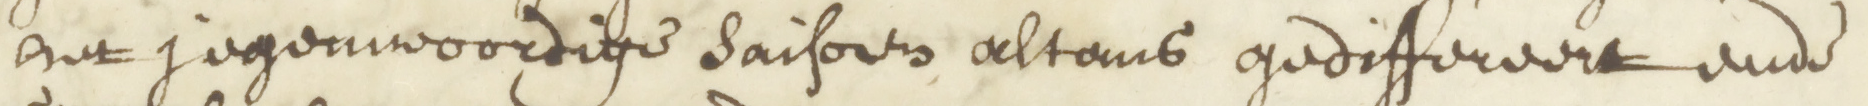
het jegenwoordige Saisoen altans gediffereert ende
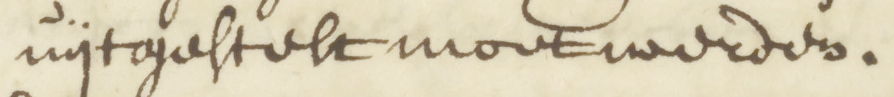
uijtgestelt moet werden.
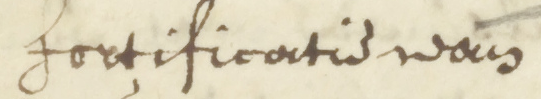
fortificatie van
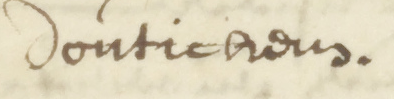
Doutichem.
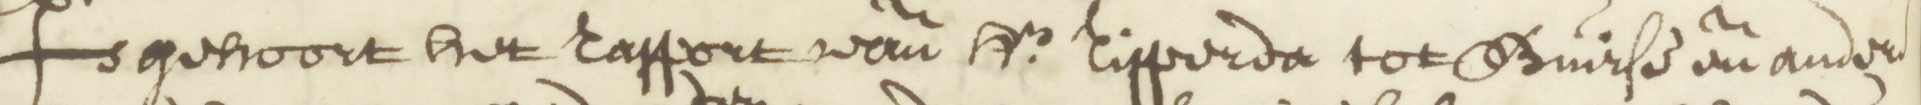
Is gehoort het rapport van Hn. Ripperda tot Buirse en andere
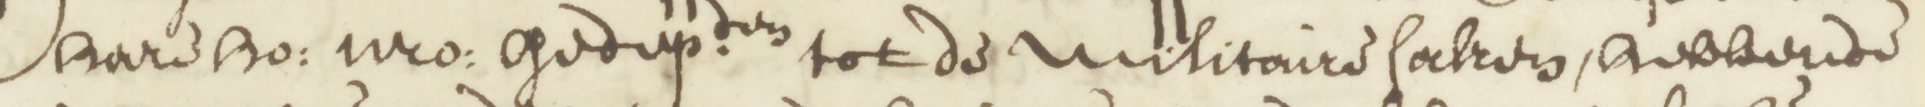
hare Ho:Mo: Gedepden. tot de Militaire saken, hebbende
